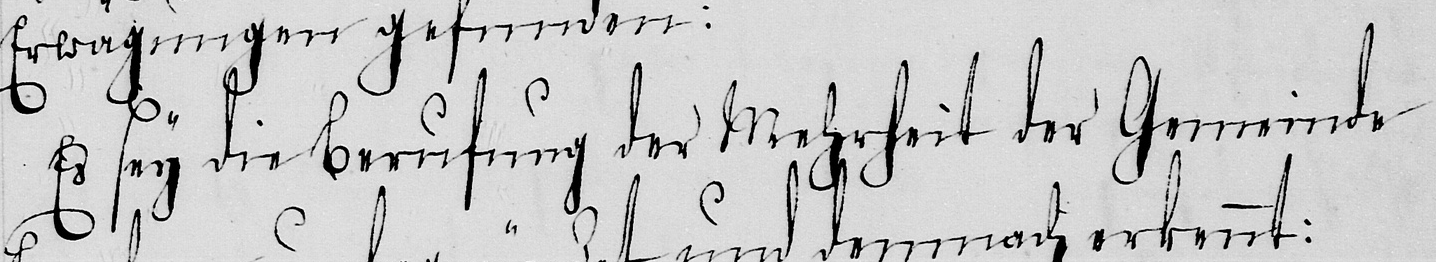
Es sey die Berufung der Mehrheit der Gemeinde
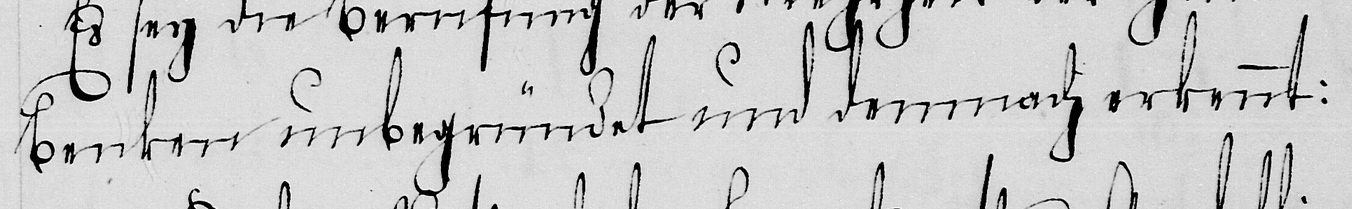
Benken unbegründet und demnach erkennt:
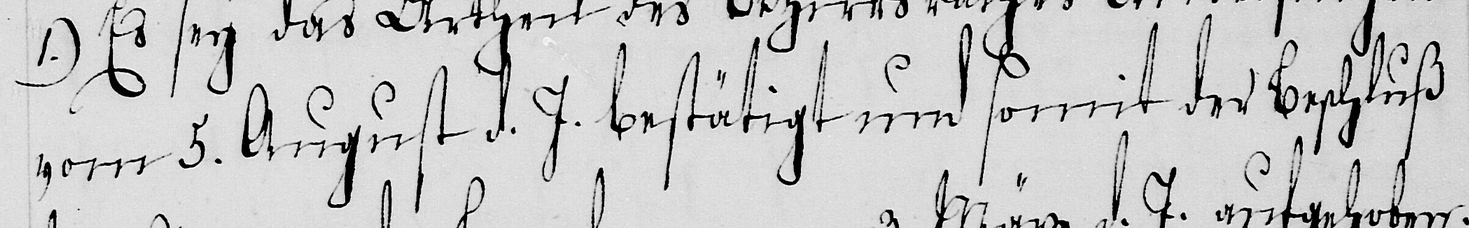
vom 5. August d. J. bestätigt und somit der Beschluß
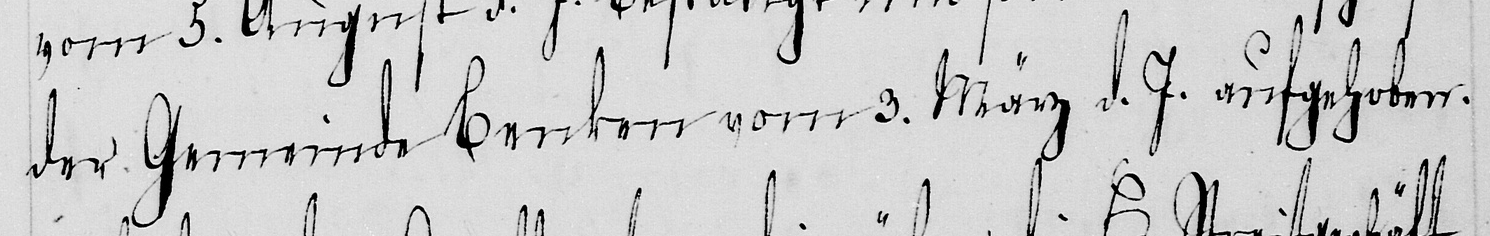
der Gemeinde Benken vom 3. März d. J. aufgehoben.
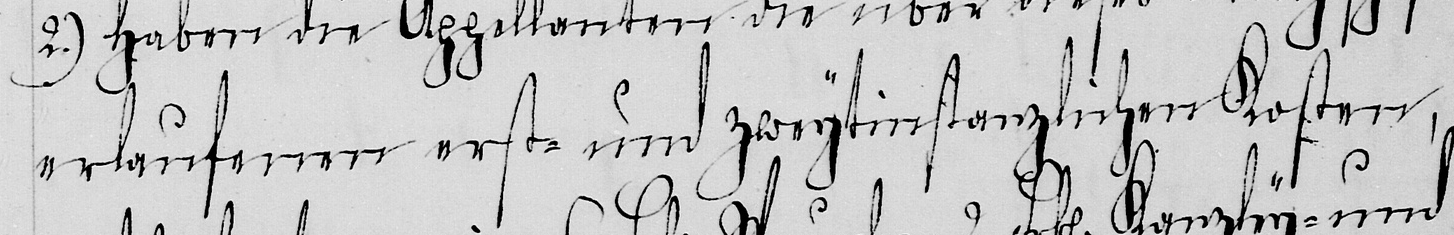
erlaufenen erst- und zweytinstanzlichen Kosten,
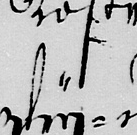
ztere
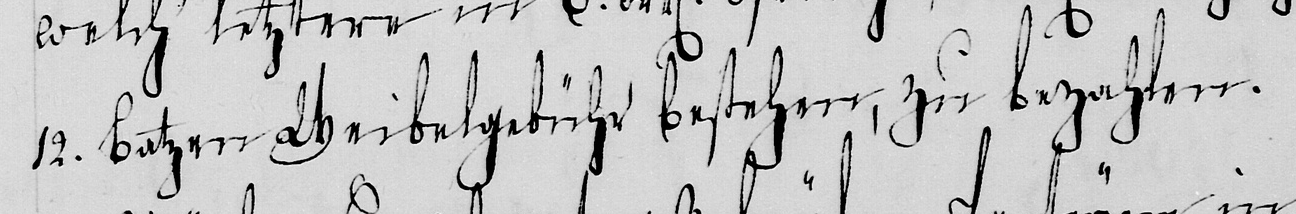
12. Batzen Weibelgebühr bestehen, zu bezahlen.
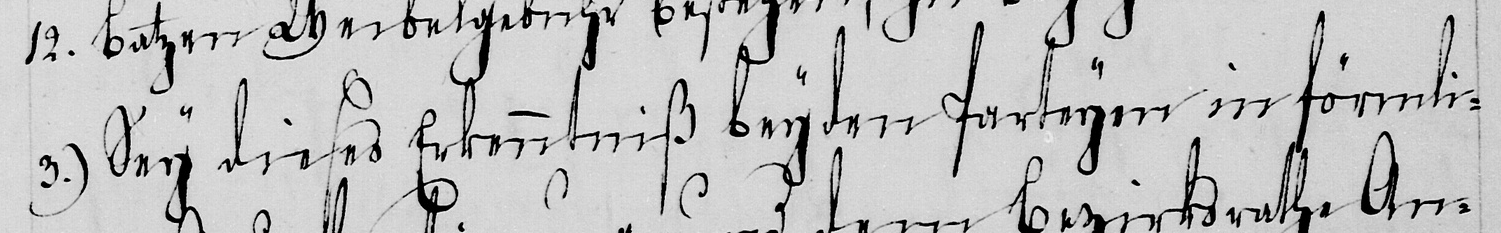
3.) Sey dieses Erkenntniß beyden Parteyen in förmli¬
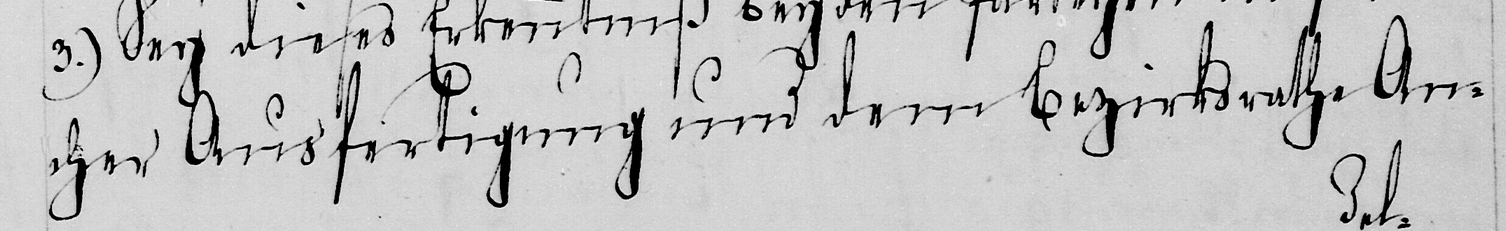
cher Ausfertigung und dem Bezirksrathe An-
